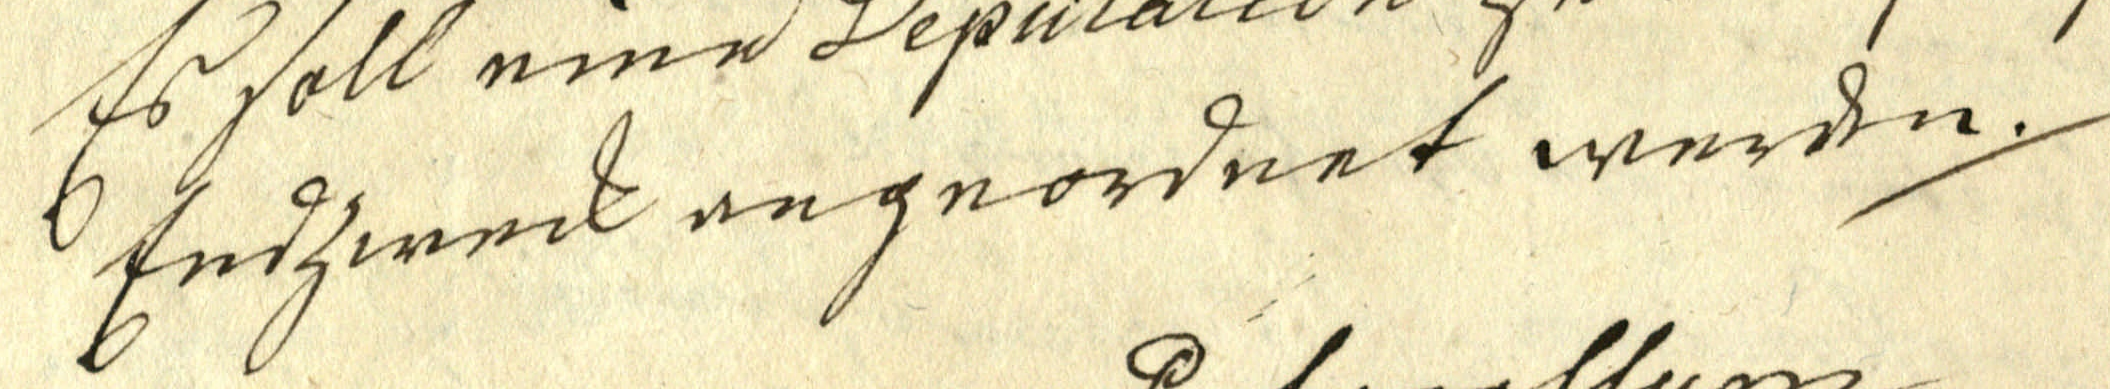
Endzweck angeordnet werden.
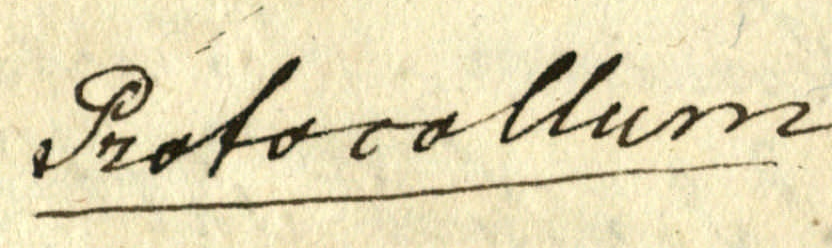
Protocollum
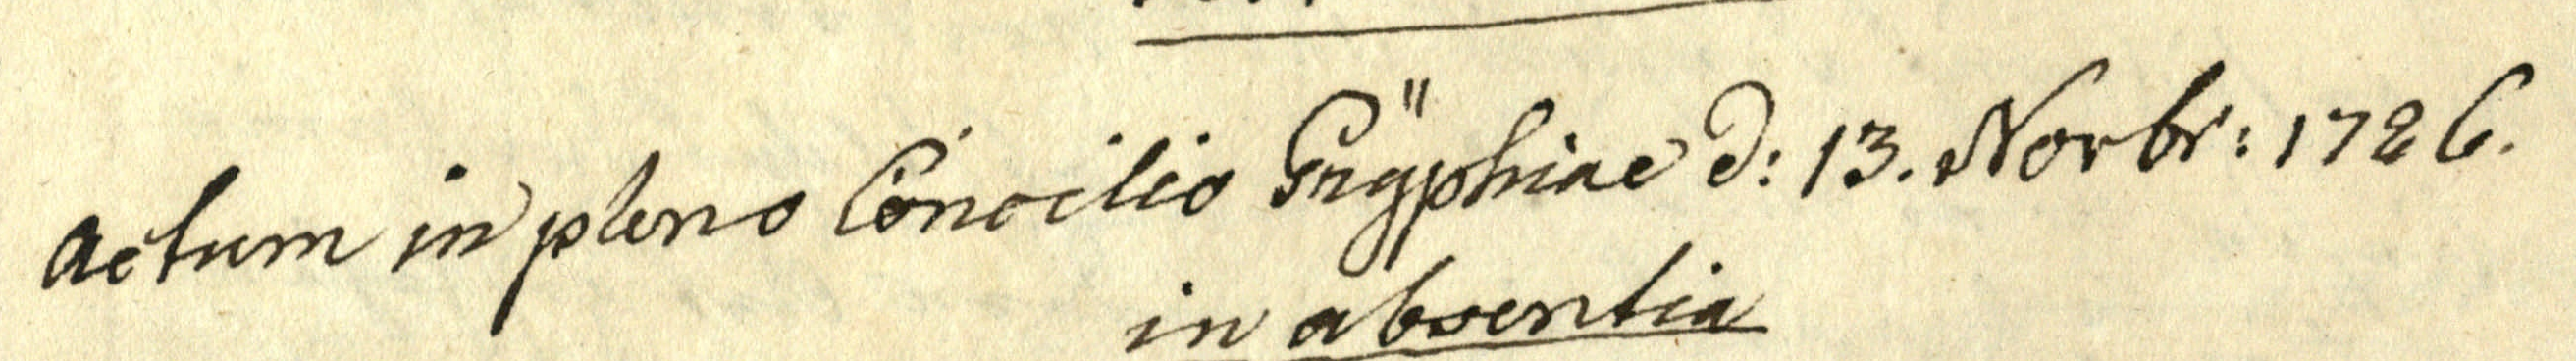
Actum in pleno Concilio Grÿphiae d. 18. Novbr. 1786.
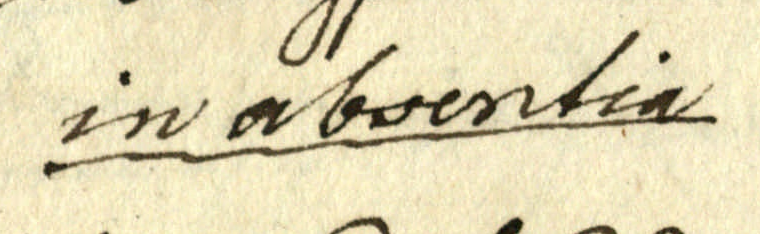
in absentia
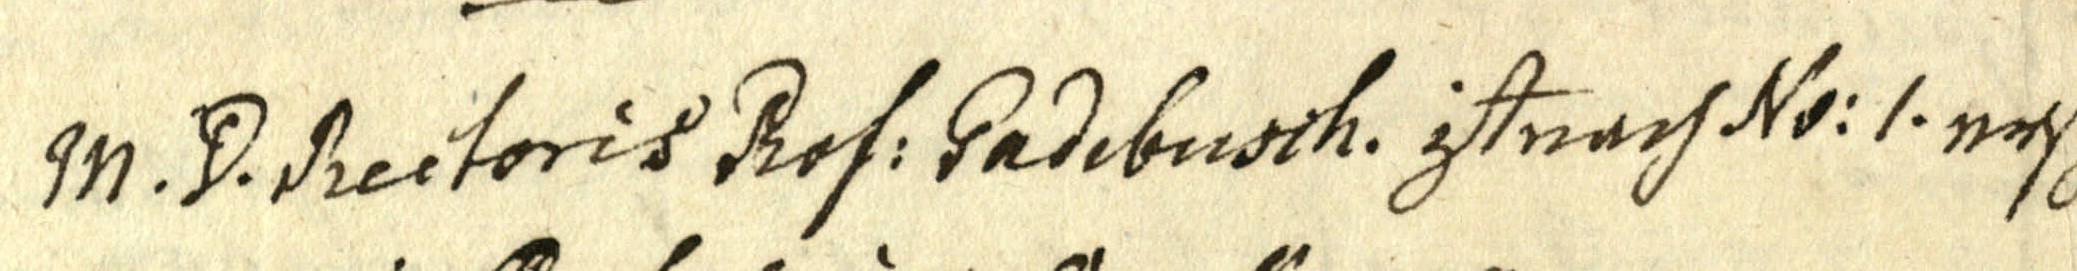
M. D. Rectoris Prof. Gadebusch. ist nach No. 1. erschienen
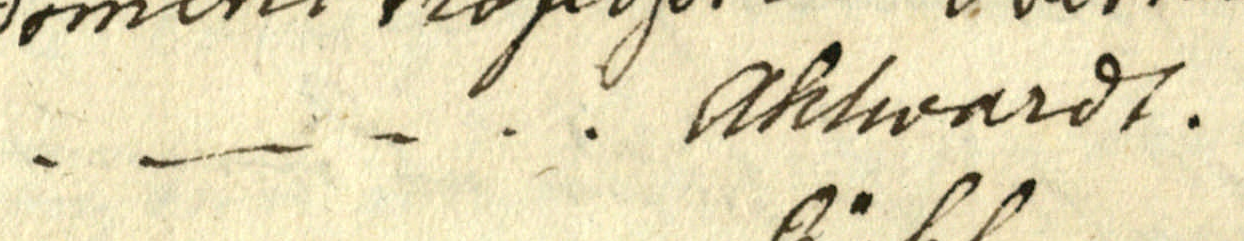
Ahlwardt.
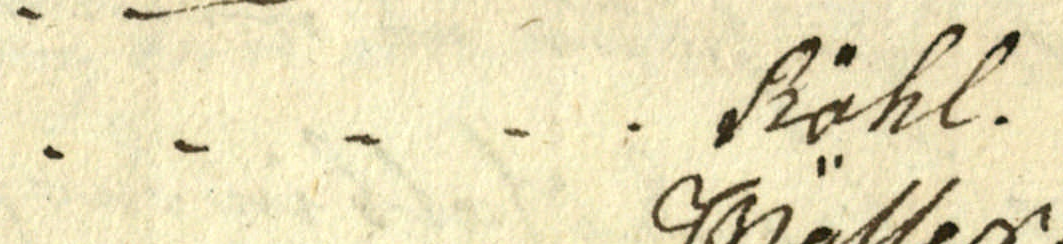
Röhl.
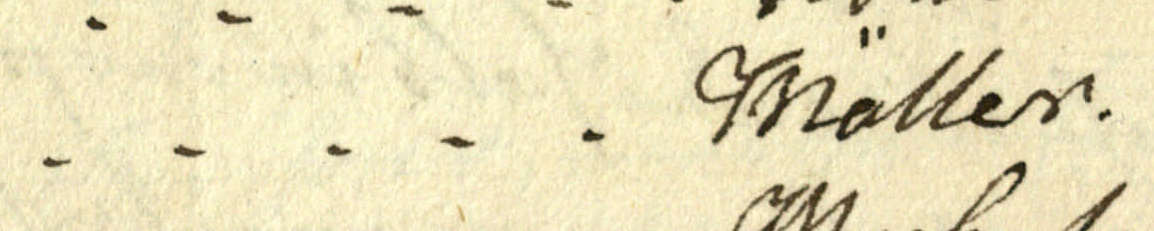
Möller.
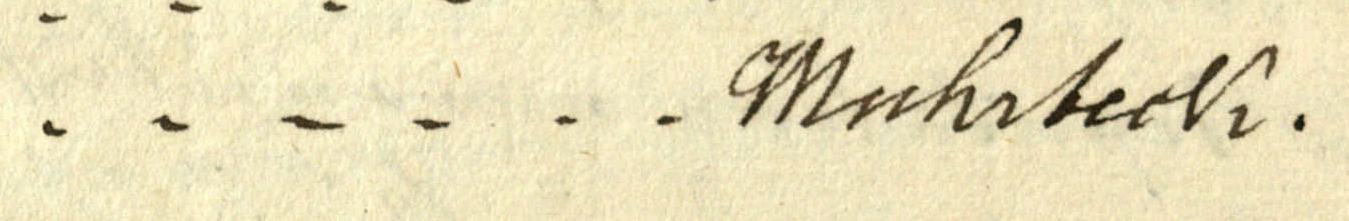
Muhrbeck.
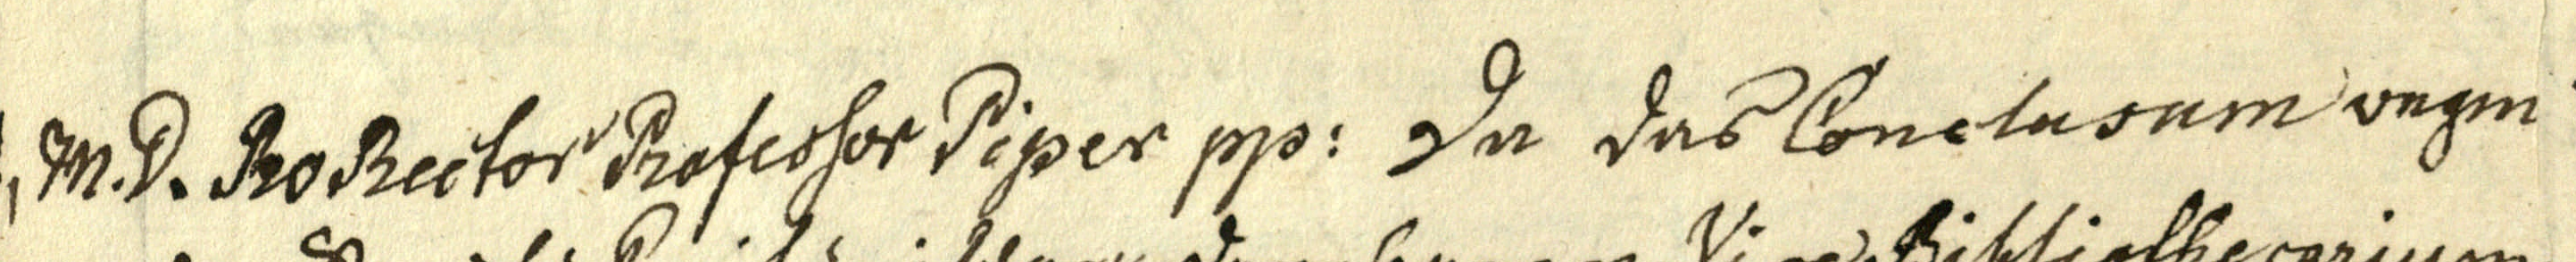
M. D. Pro Rector Professor Piper pp. Da das Conclusum wegen
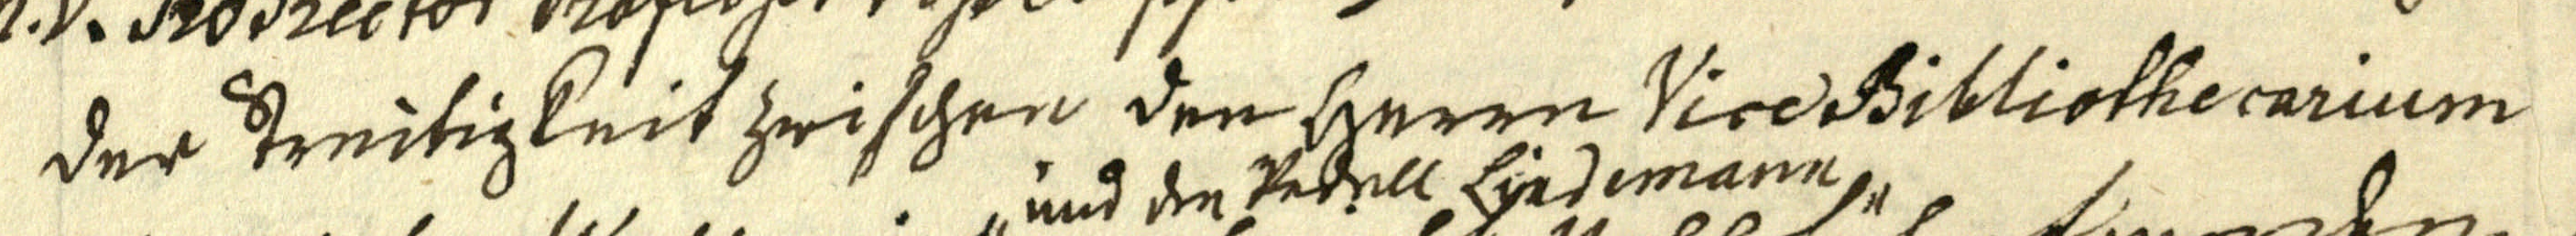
der Streitigkeit zwischen den Herrn Vice Bibliothecarium
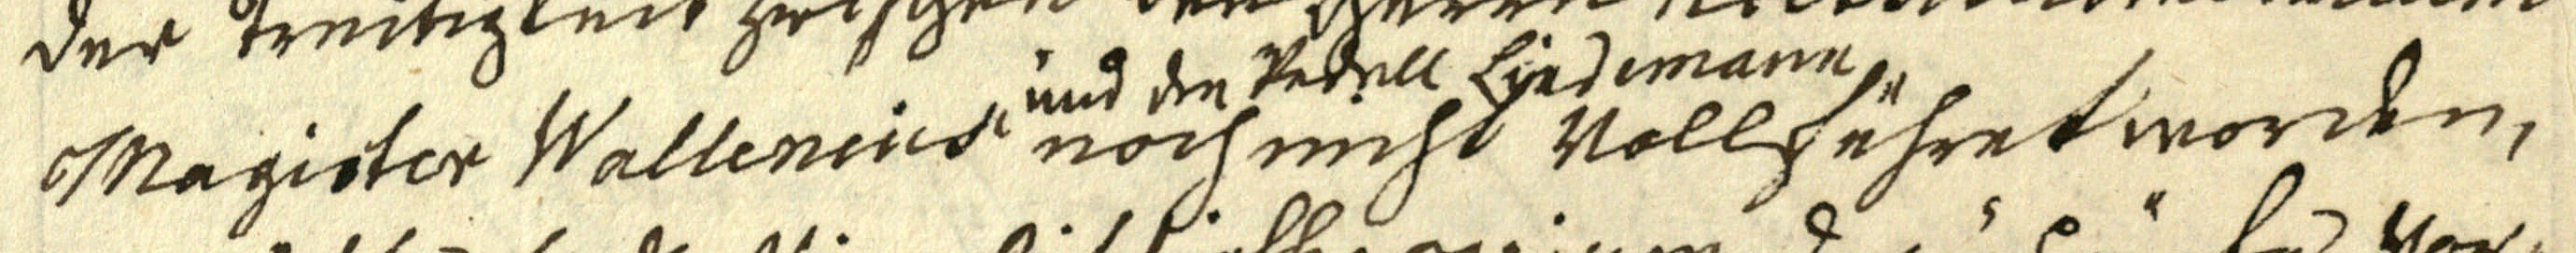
Magister Wallenius und den Pedell Lindemann noch nicht vollführet worden,
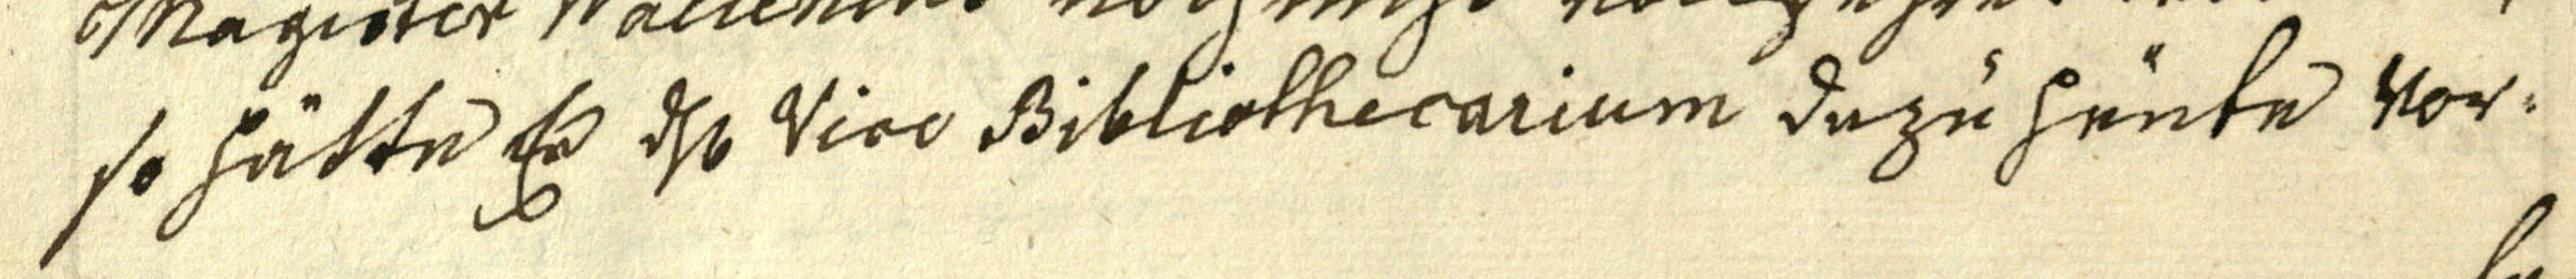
so hätte Er dh Vice Bibliothecarium dazu heute vor¬
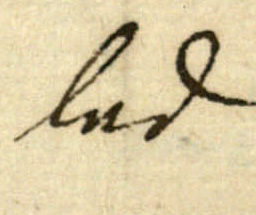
lad
